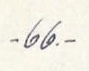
66
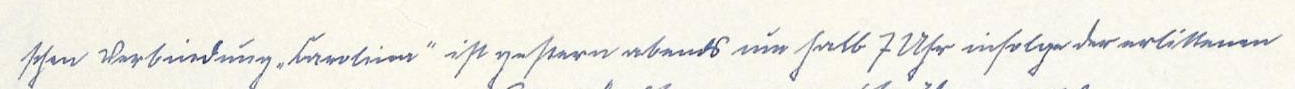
ischen Verbindung „Carolina“ ist gestern abends um halb 7 Uhr infolge der erlittenen
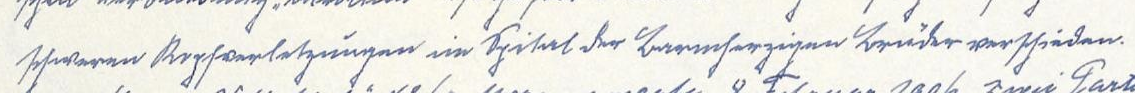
schweren Kopfverletzungen im Spital der Barmherzigen Brüder verschieden.
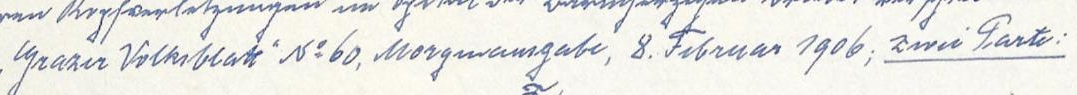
„Grazer Volksblatt Nr. 60, Morgenausgabe, 8. Februar 1906, zwei Parte:
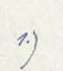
1)
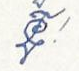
Cl
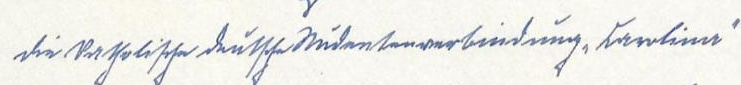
Die katholische deutsche Studentenverbindung „Carolina“
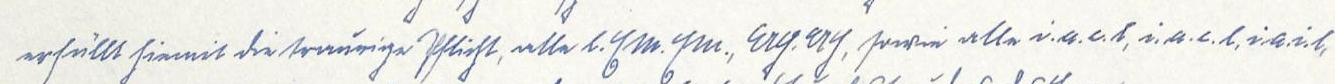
erfüllt hiermit die traurige Pflicht, alle l. EM. EM., AH AH, sowie alle i. a. c. l. i. a. c. l., i. a. i. l.
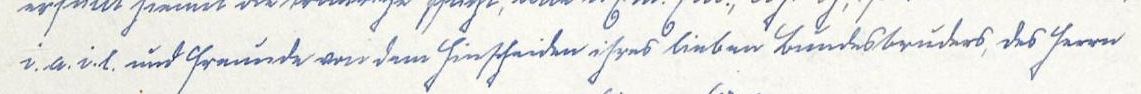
i. a. i. l. und Freunde von dem Hinscheiden ihres lieben Bundesbruders, des Herrn
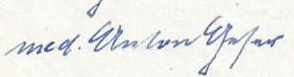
med. Anton Geser
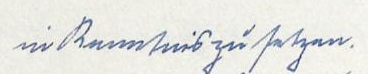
in Kenntnis zu setzen.
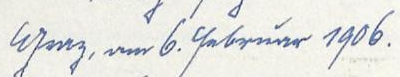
Graz, am 6. Februar 1906
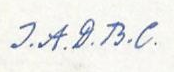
I. A. D. B. C.
